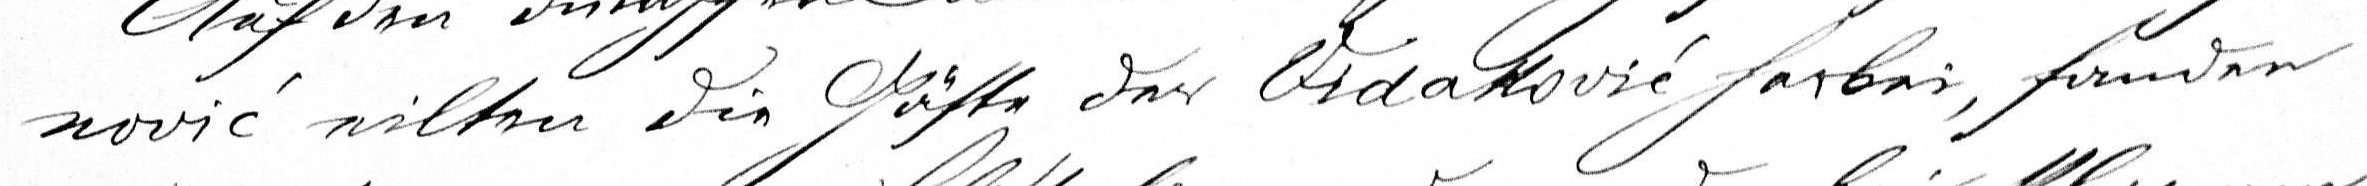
nović eilten die Gäste der Vidaković herbei, fanden
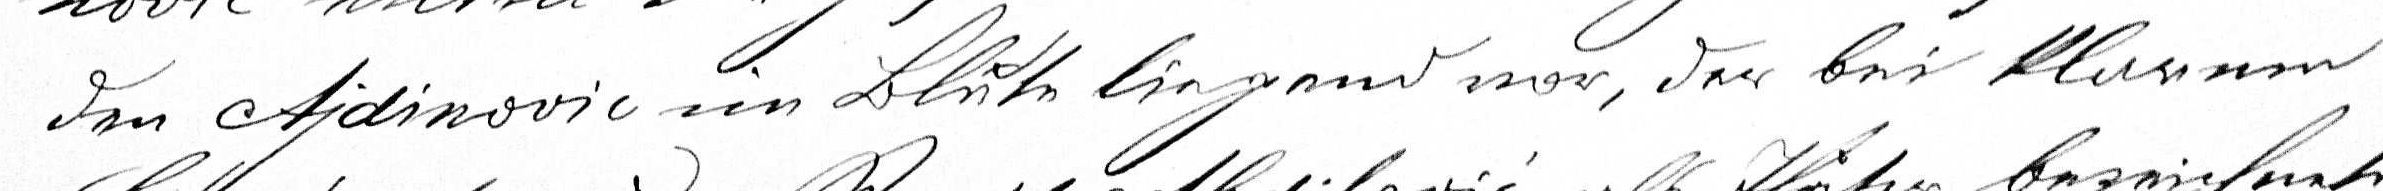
den Ajdinović im Blute liegend vor, der bei klarem
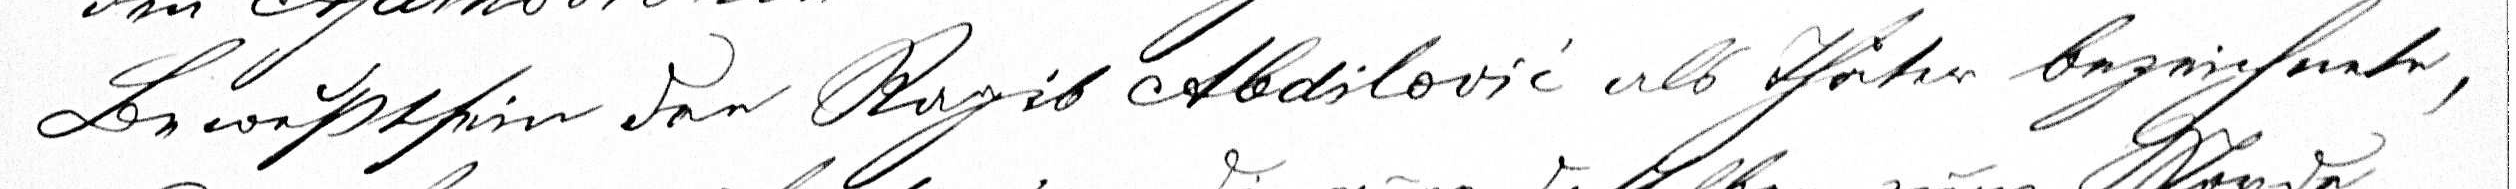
Bewußtsein den Ragib Abdilović als Thäter bezeichnete,
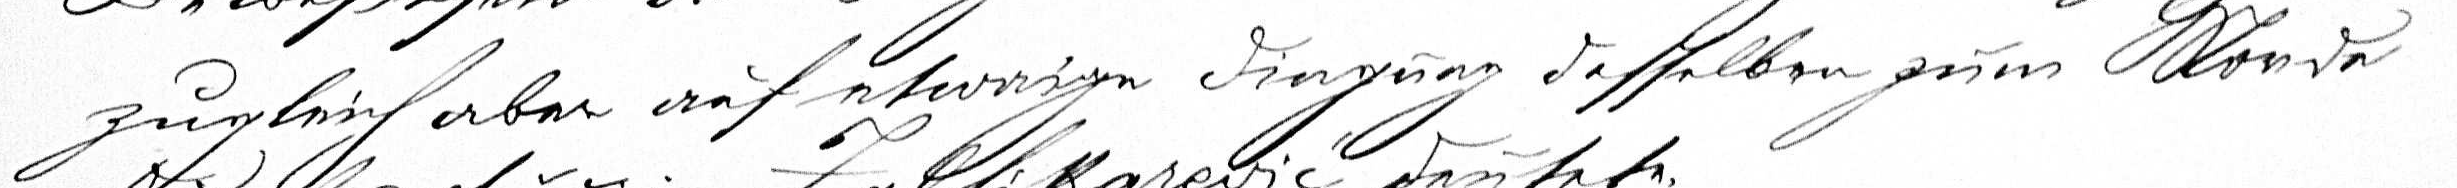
zugleich aber auf etwaige Dingung desselben zum Morde
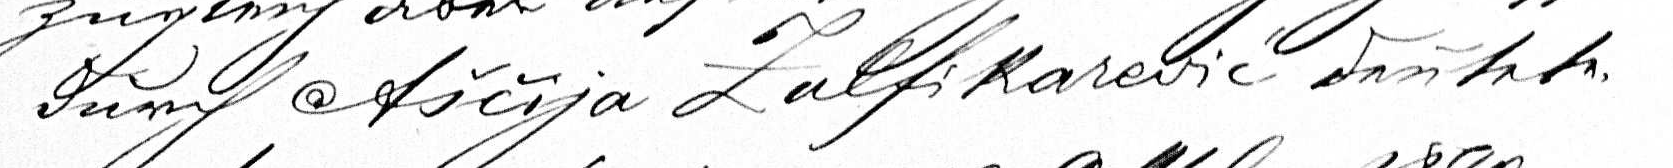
durch Aščija Zulfikarević deutete.
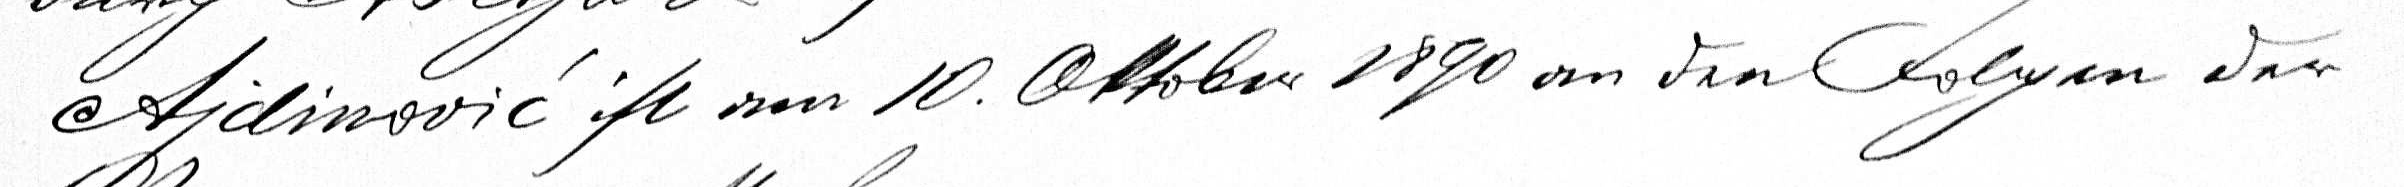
Ajdinović ist am 10. Oktober 1890 an den Folgen der
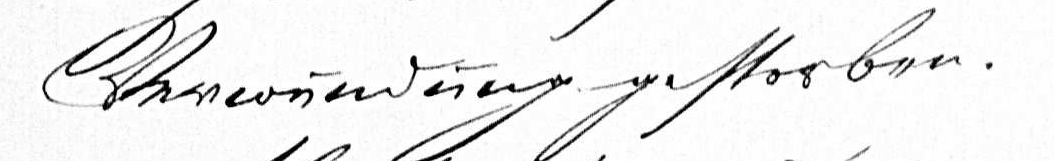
Verwundung gestorben.
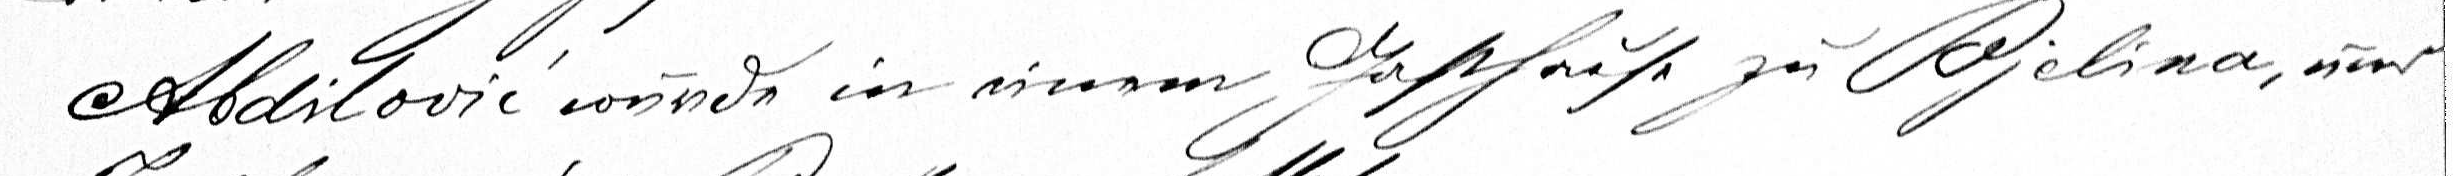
Abdilović wurde in einem Gasthause zu Bjelina, und
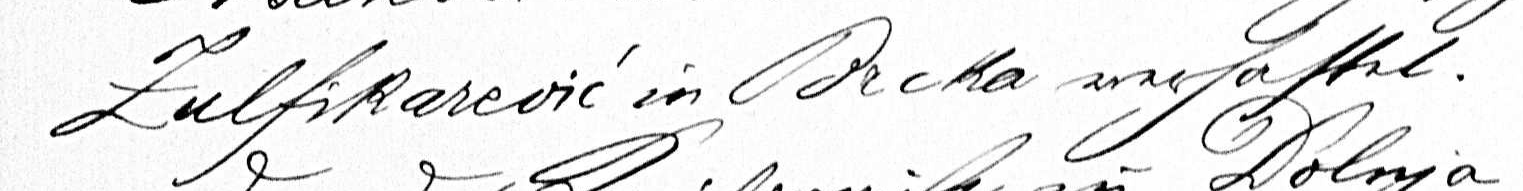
Zulfikarević in Brcka verhaftet.
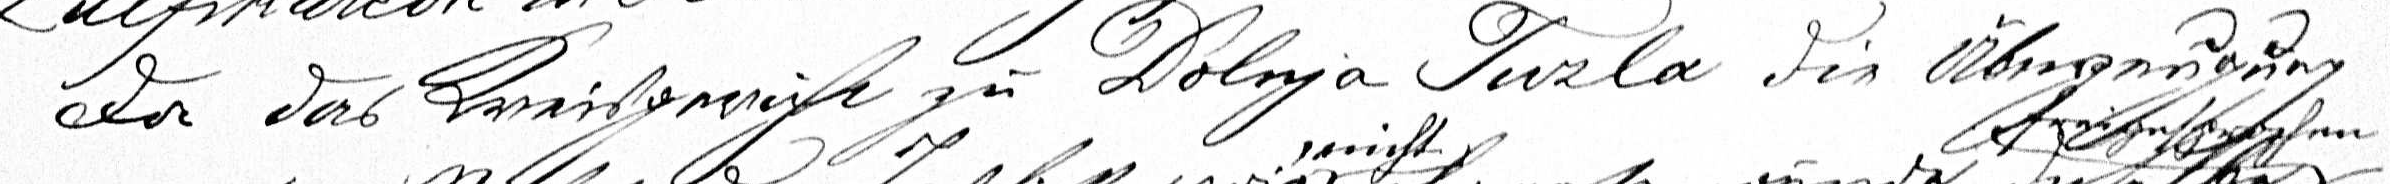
Da das Kreisgericht zu Dolnja Tuzla die Überzeugung
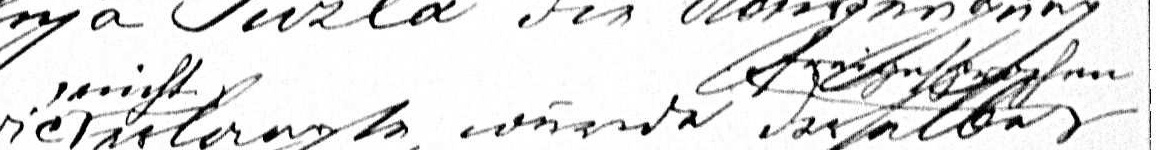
nicht freigesprochen
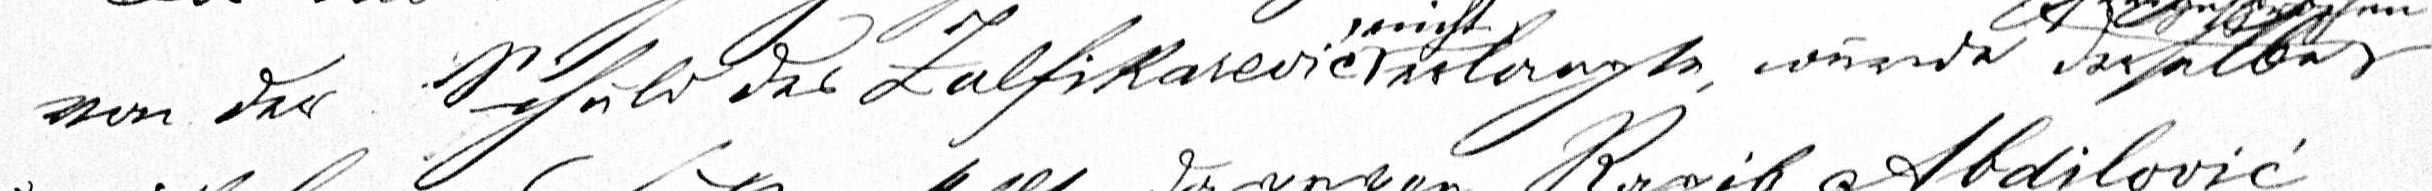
von der Schuld des Zulfikarević erlangte, wurde derselbe
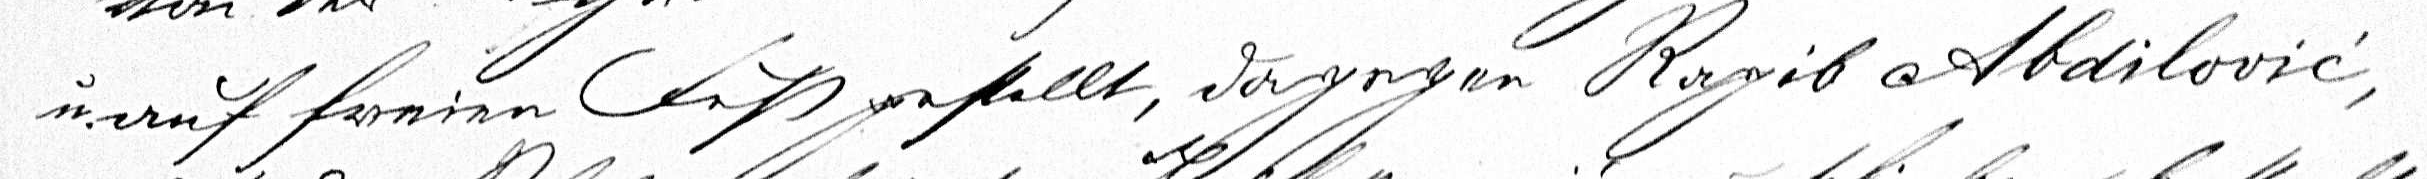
u. auf freien Fuß gestellt, dagegen Ragib Abdilović,
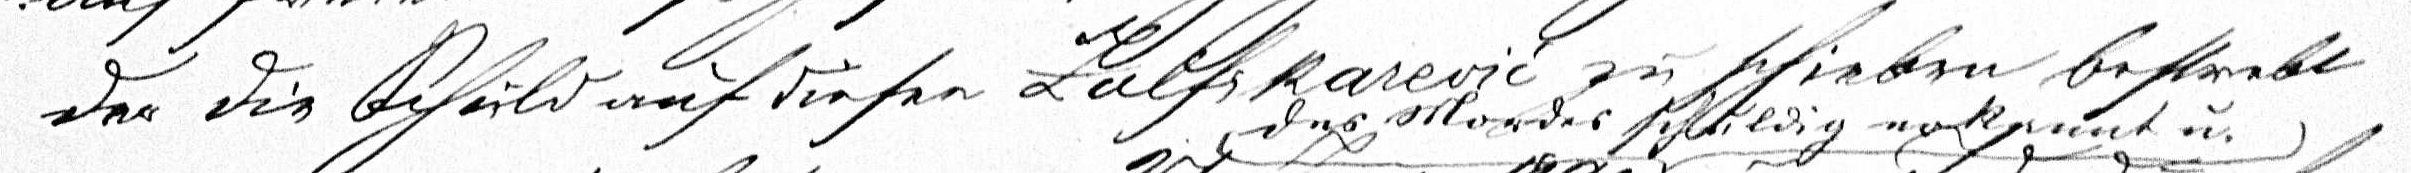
der die Schuld auf dieser Zulfikarević zu schieben gestrebt
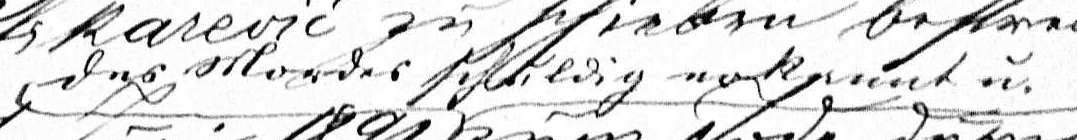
des Mordes schuldig erkannt u.
